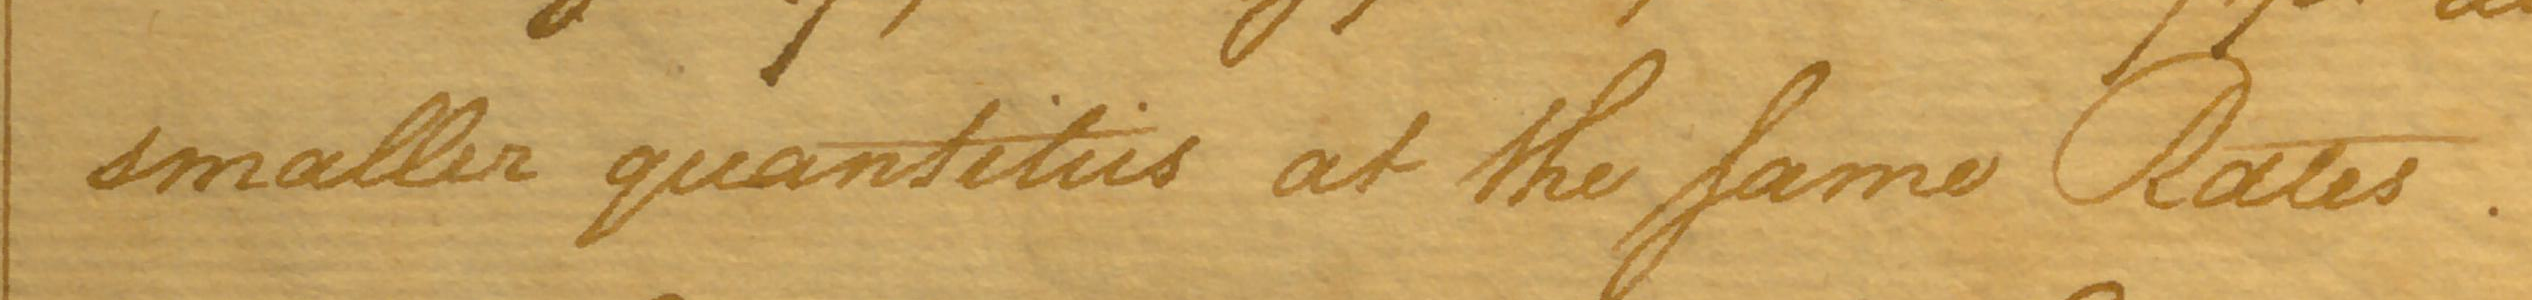smaller quantities at the same Rates.
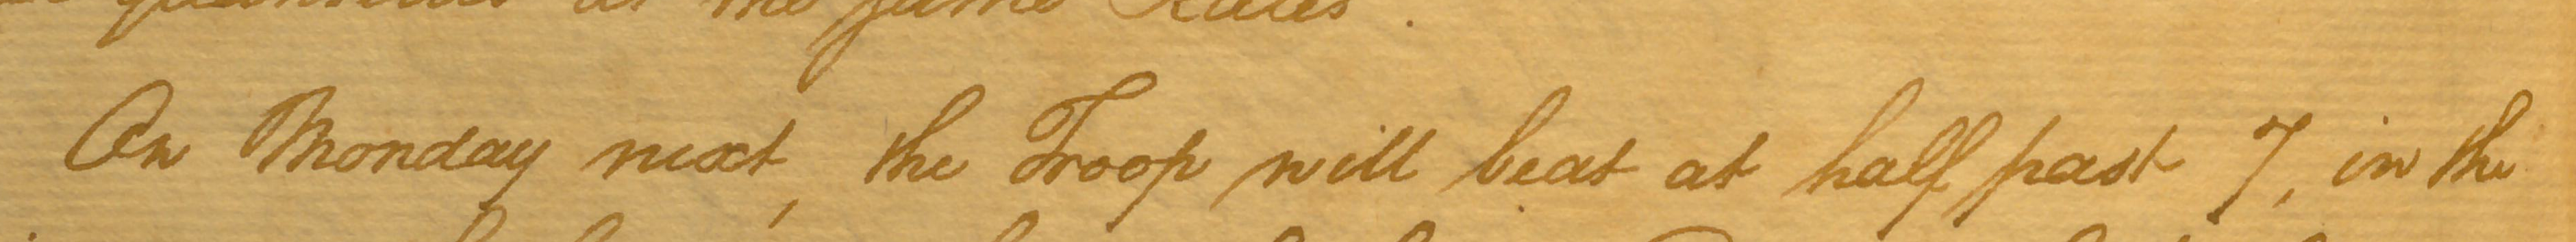on Monday next, the Troop will beat at half past 7, in the
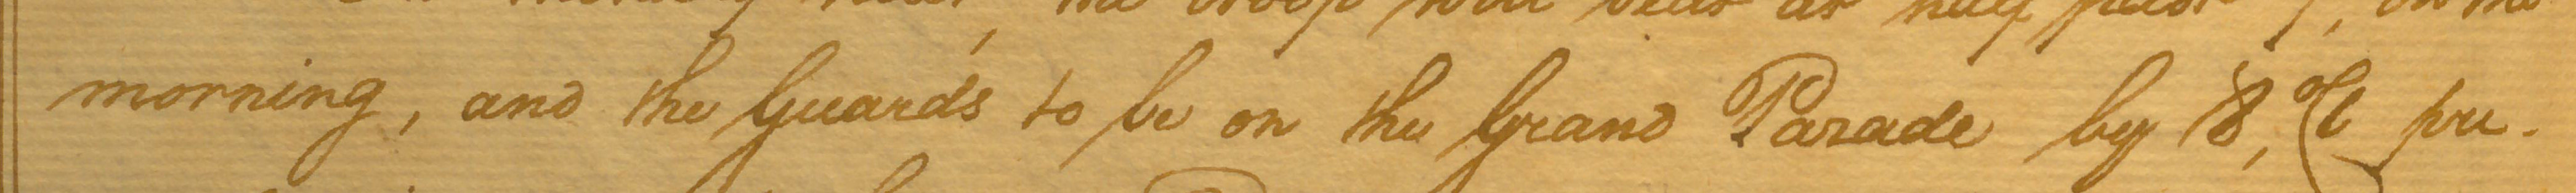morning, and the Guards to be on the Grand Parade by 8, ^oCl pre-
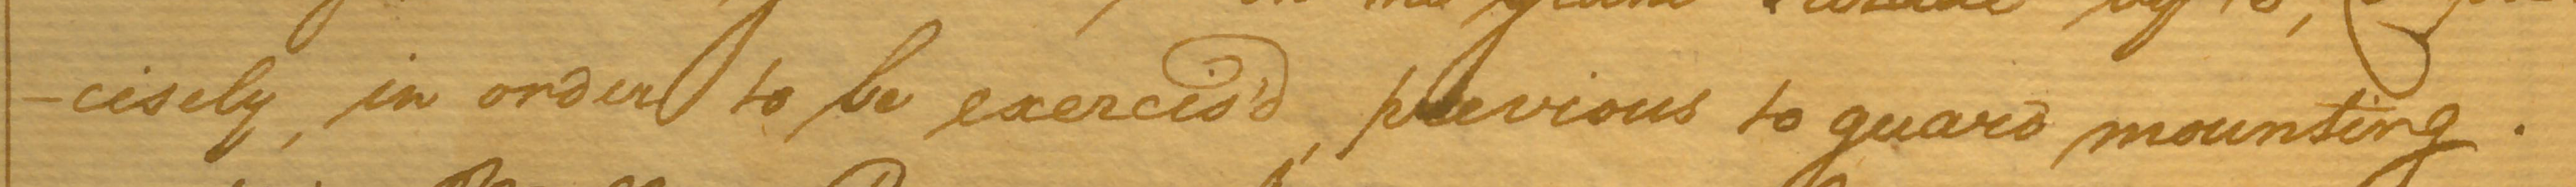-cisely, in order to be exercis'd previous to guard mounting.
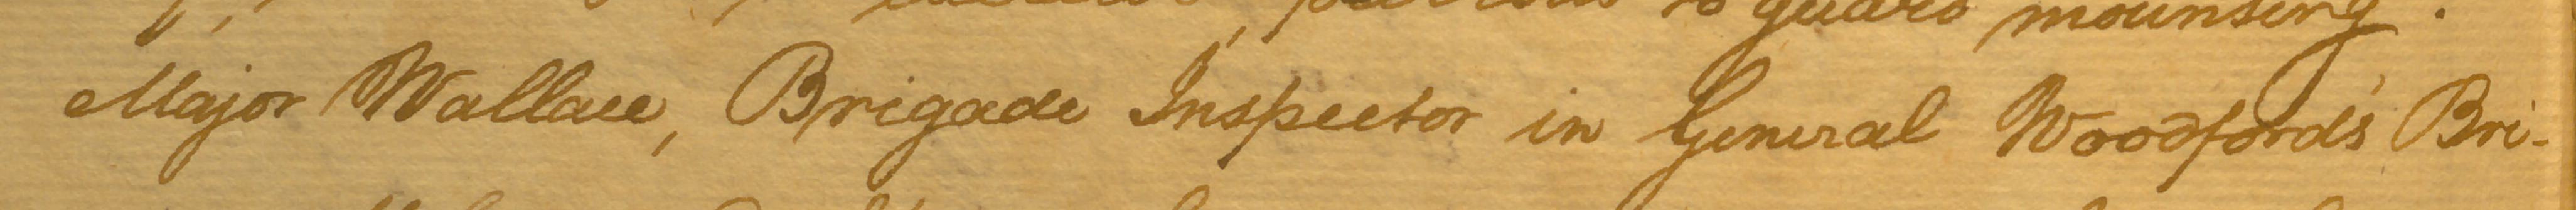Major Wallace, Brigade Inspector in General Woodford's Bri-
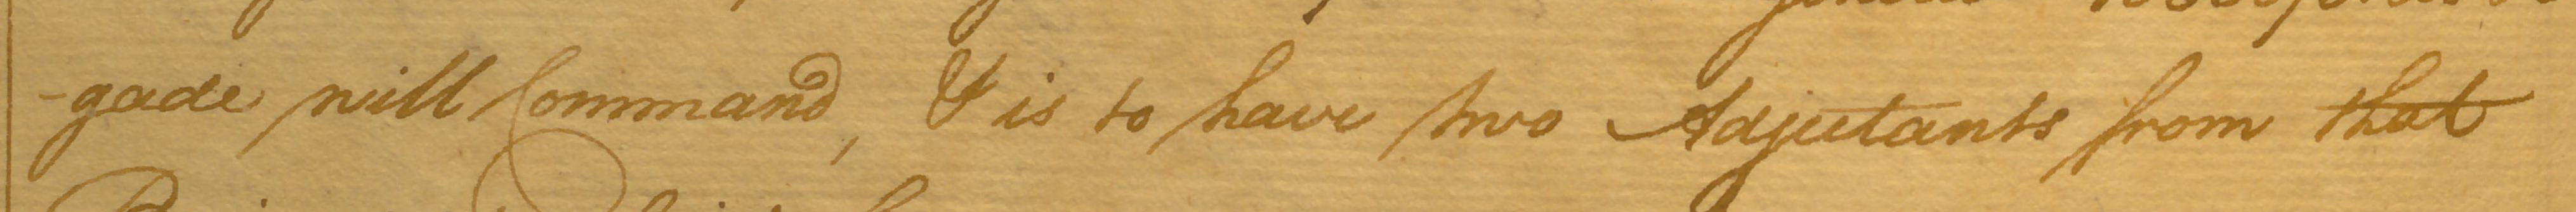-gade will Command, & is to have two Adjutants from that
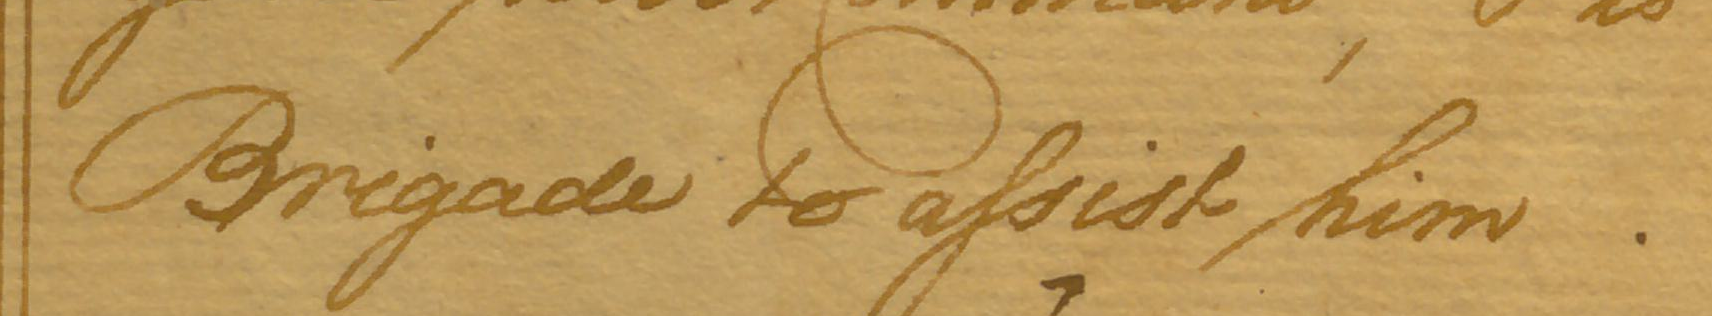Brigade to assist him.
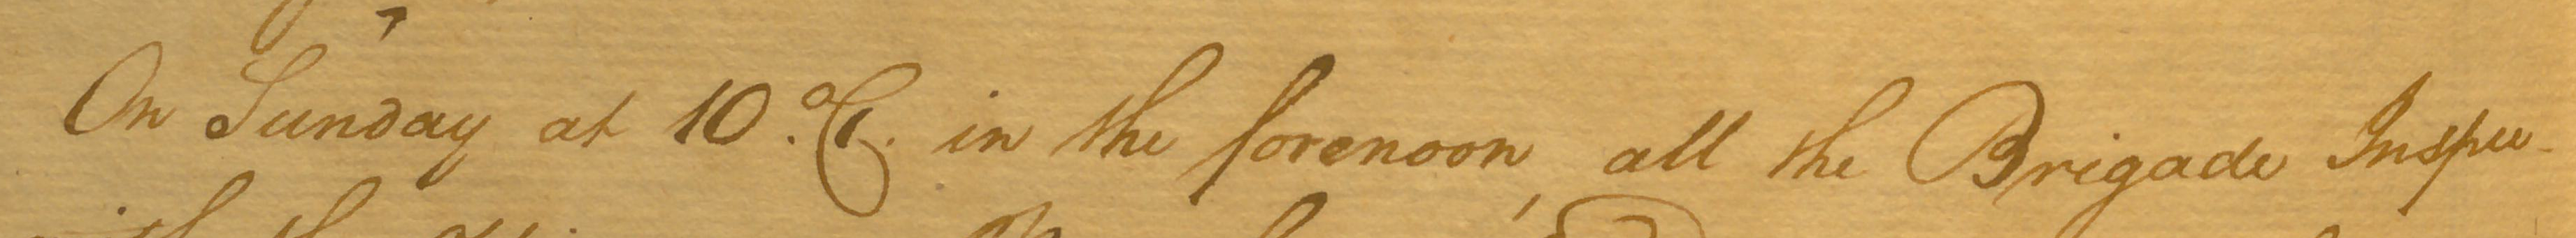On Sunday at 10. ^oCl. in the forenoon, all the Brigade Inspec
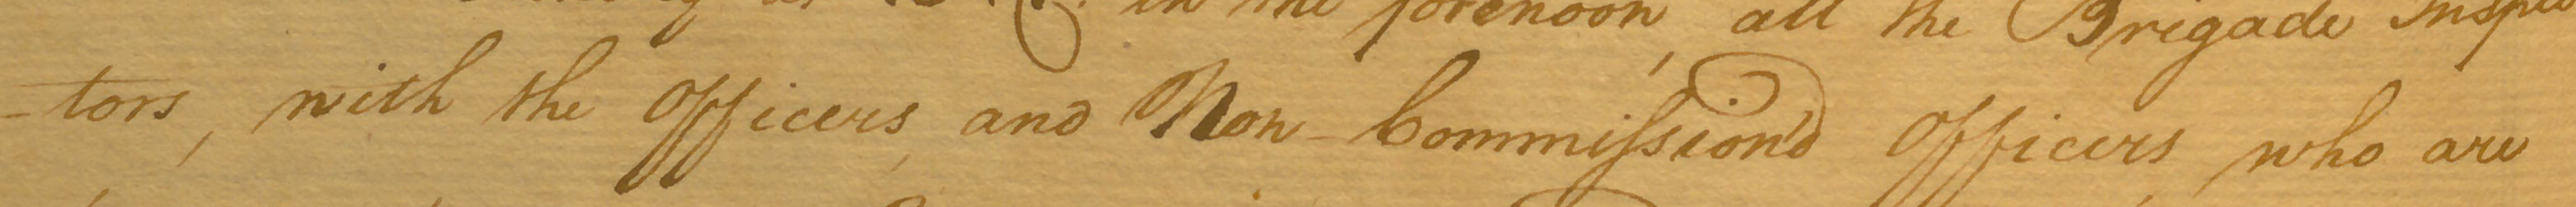-tors, with the Officers and non-Commission'd Officers who are
